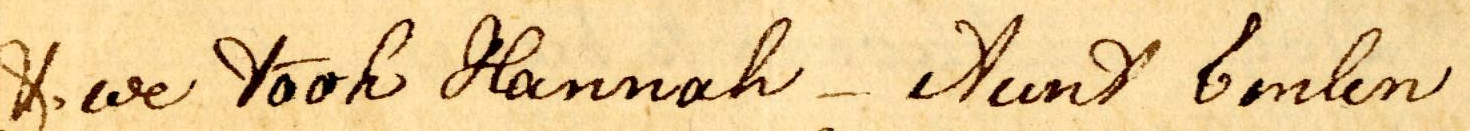& we took Hannah- Aunt Emlen
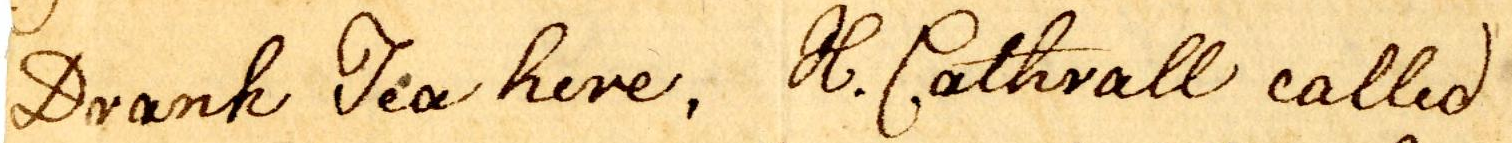Drank Tea here, H. Cathrall called
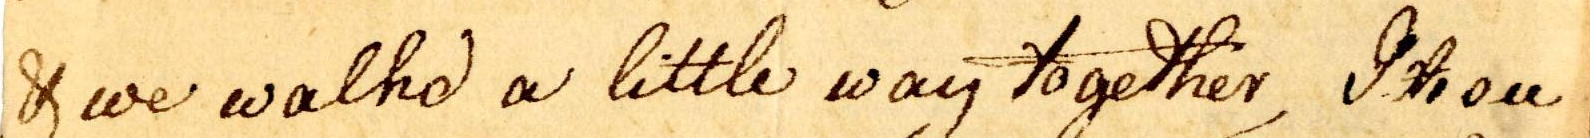& we walkd a little way together I to see
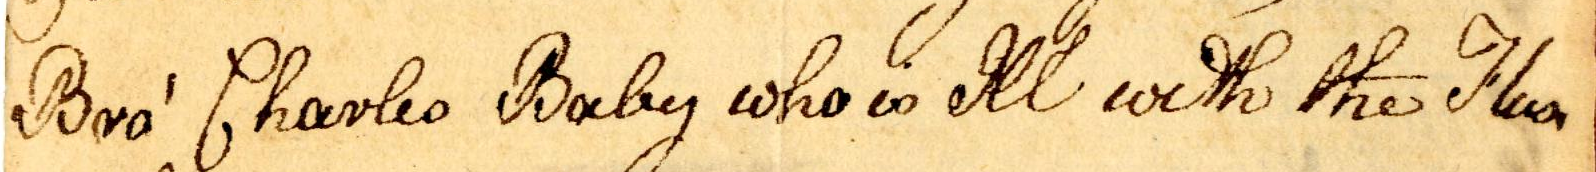Bro' Charles Baby who is Ill with the Flux
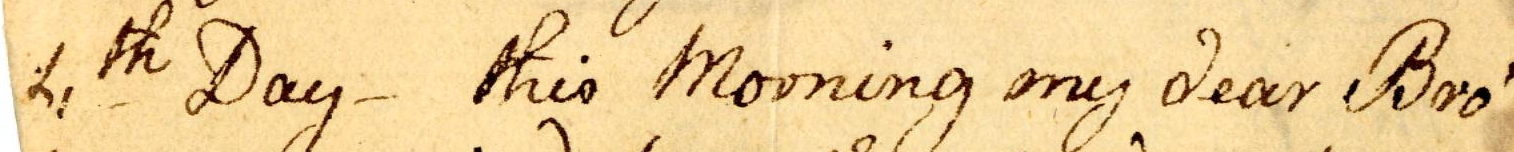4^th Day- this Morning my dear Bro'
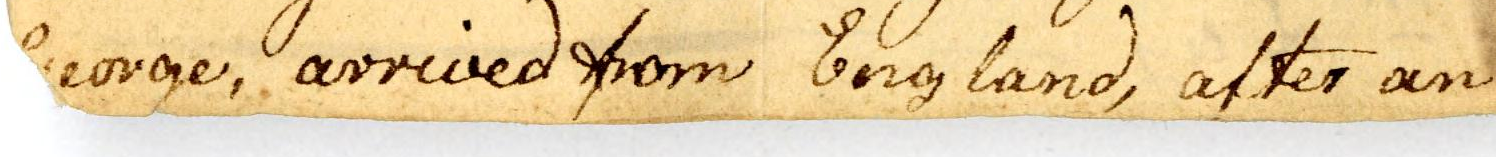George, arrived from England, after an
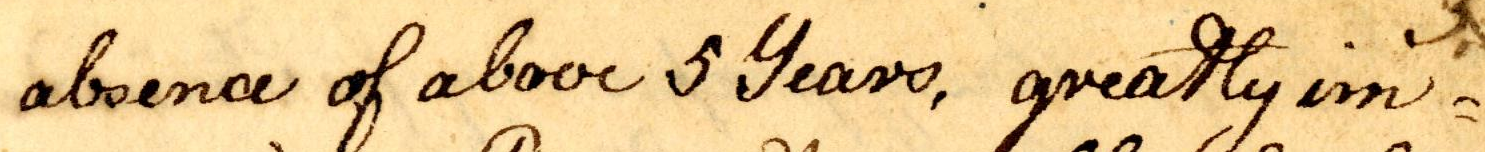absence of above 5 Years, greatly im-
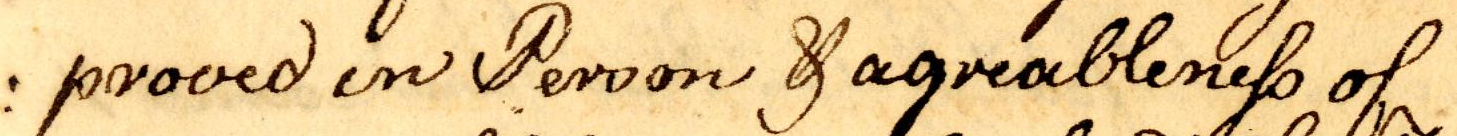-proved in Person & agreableness of
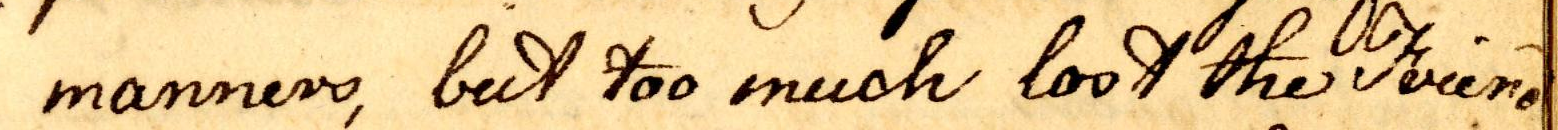manners, but too much lost the Friend
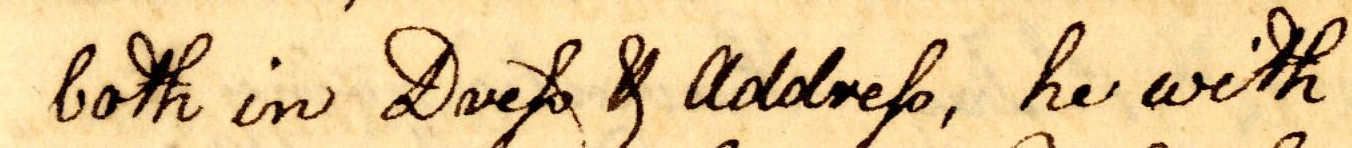both in Dress & Address, he with
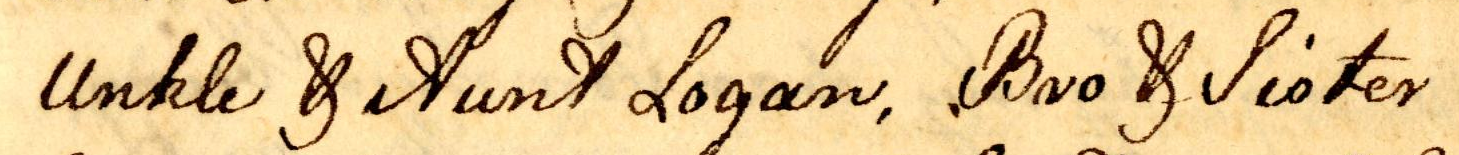Unkle & Aunt Logan, Bro & Sister
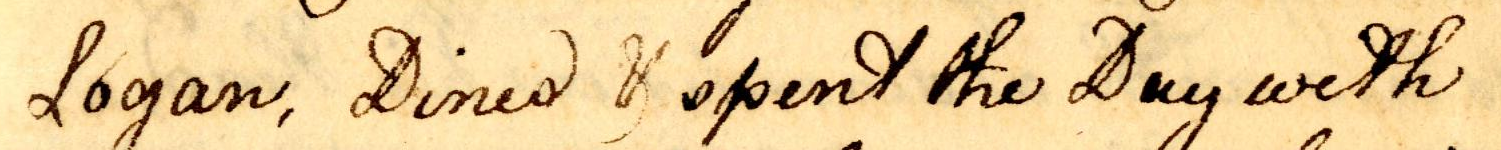Logan, Dined & spent the Day with
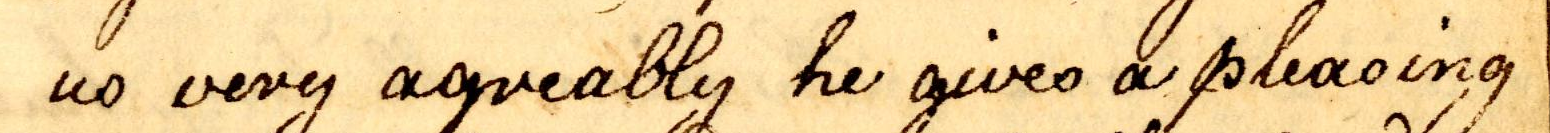us very agreably he gives a pleasing
